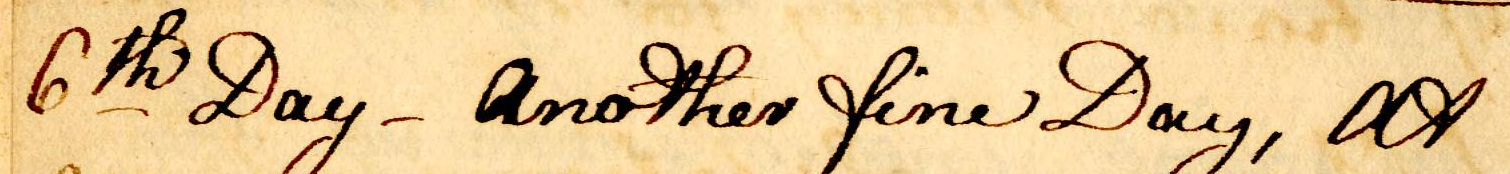6^th Day- Another fine Day, At
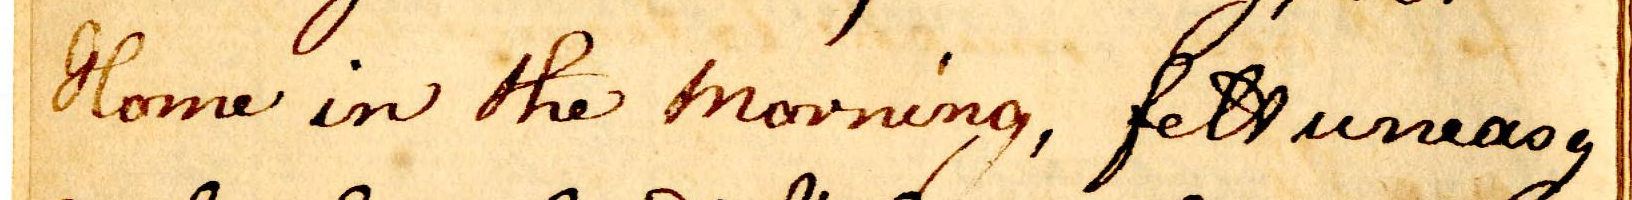Home in the Morning, felt uneasy
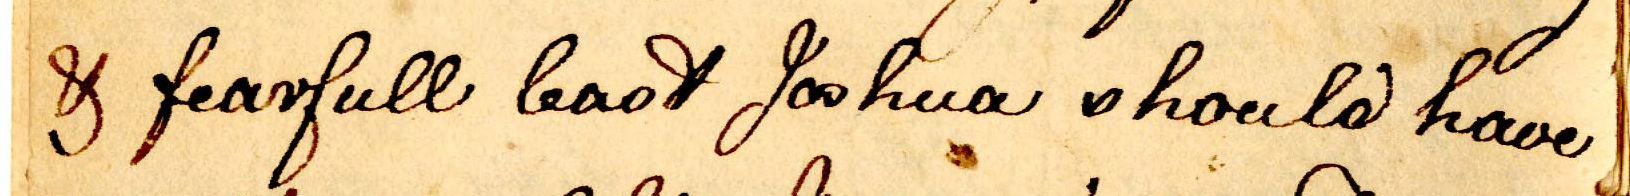& fearfull least Joshua should have
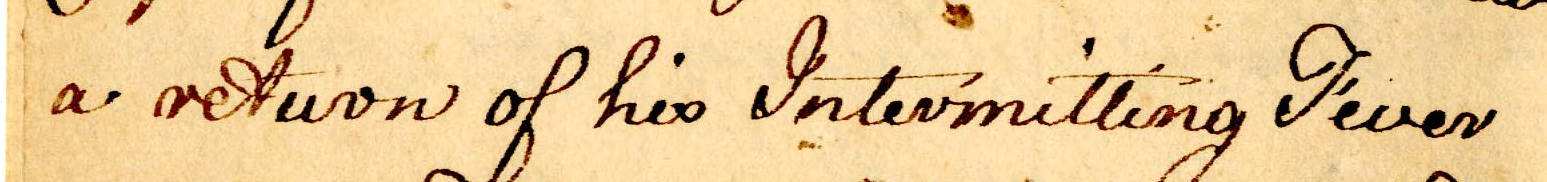a return of his Intermitting Fever
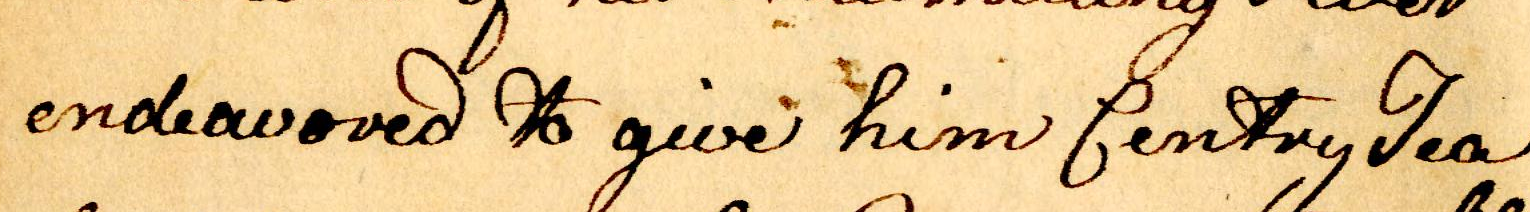endeavored to give him Centry Tea
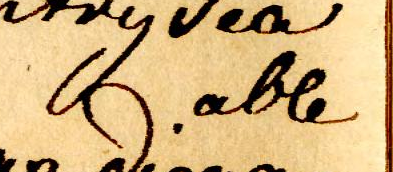able
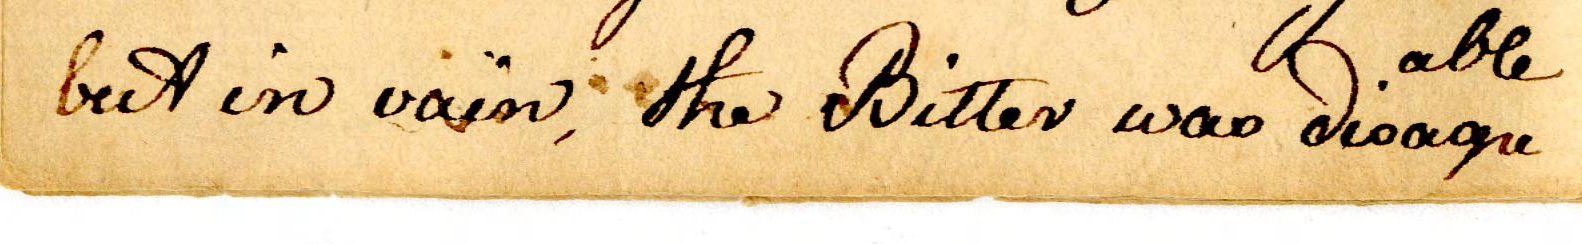but in vain, the Bitter was diagre
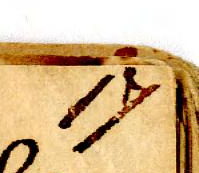17
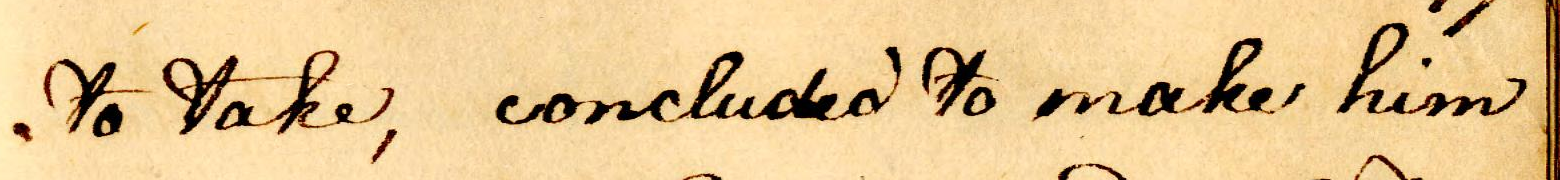to take, concluded to make him
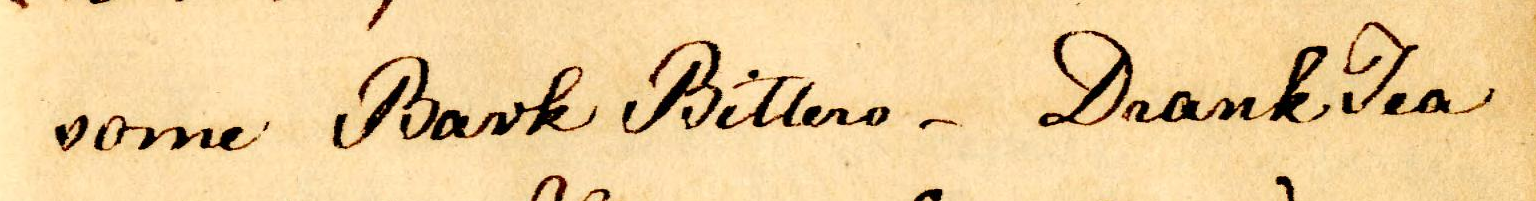some Bark Bitters- Drank Tea
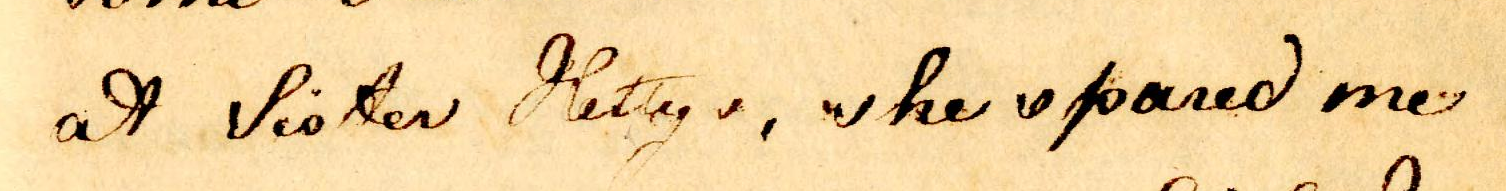at Sister Hettys, she spared me
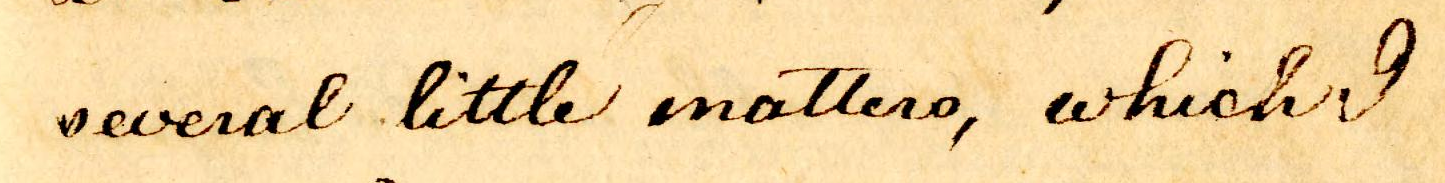several little matters, which I
